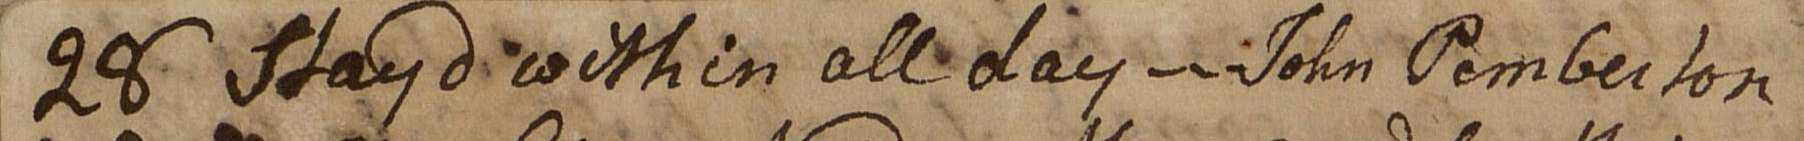28 Stayd within all day- John Pemberton
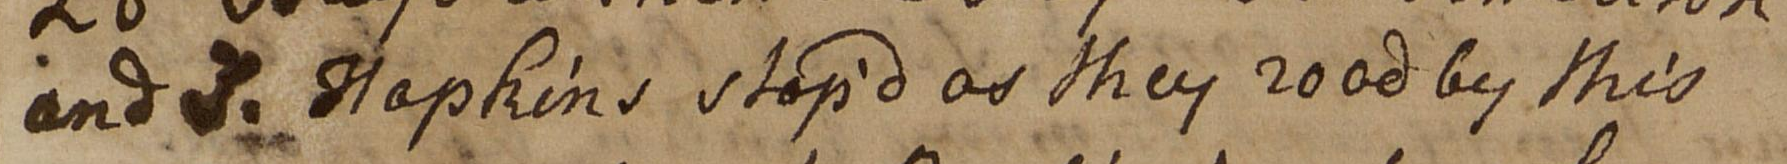and J. Hopkins stop'd as they road by this
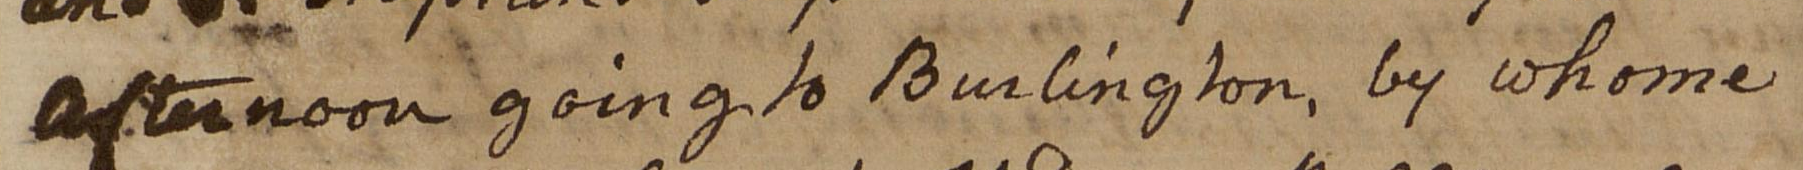Afternoon going to Burlington, by whome
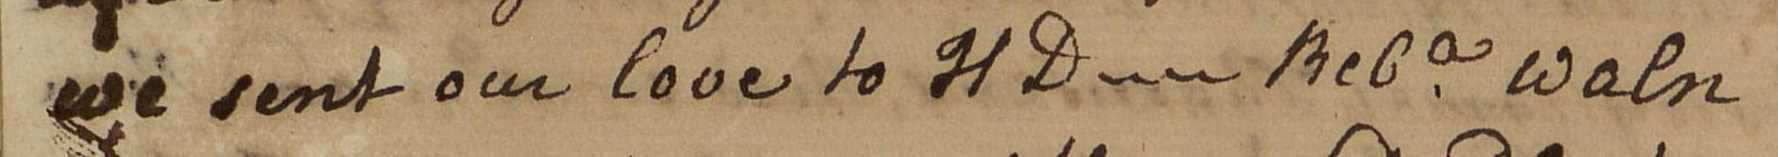we sent our love to HD-- Reb^a. Waln
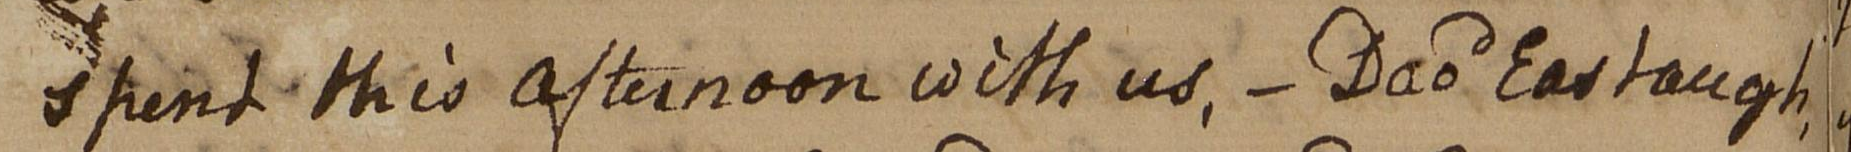spent this afternoon with us,- Da[o]^d Eastaugh,
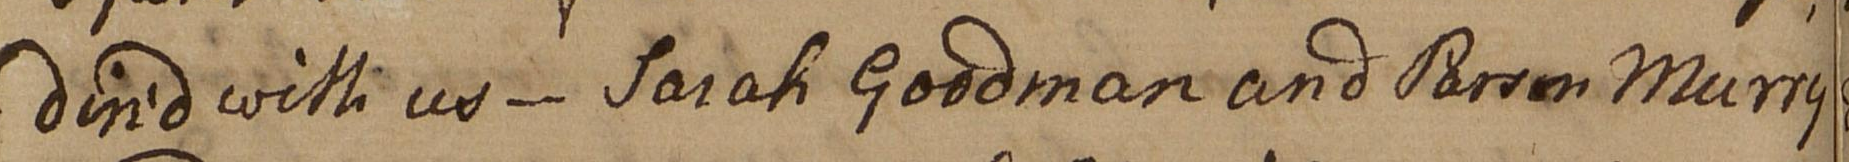din'd with us- Sarah Goodman and Parson Murry
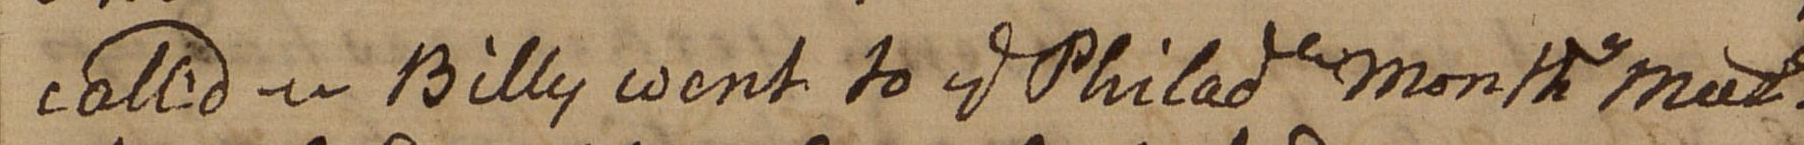called- Billy went to y^e Philad^a month^y meet^g
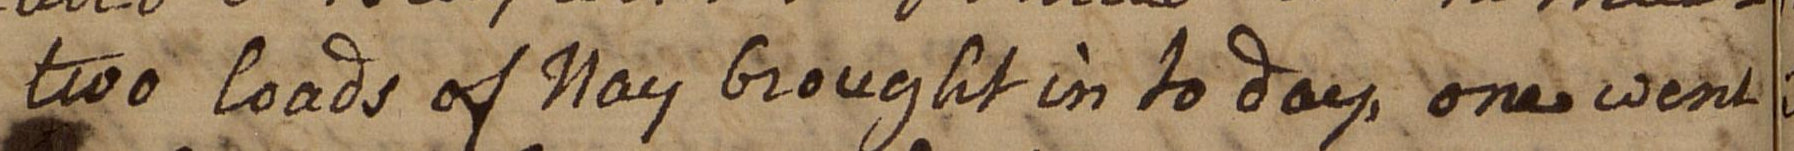two loads of Hay brought in to day, one went
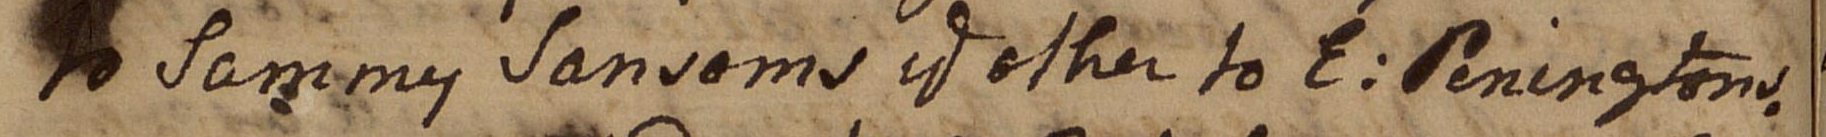to Sammy Sansoms y^e other to E: Peningtoms.
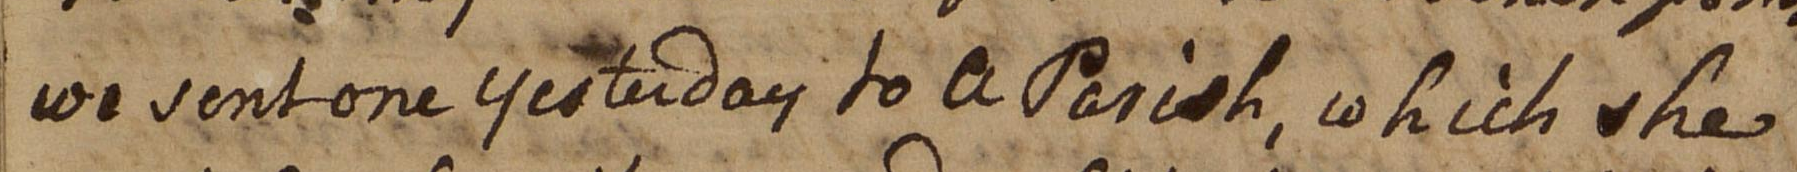wo sent one yesterday to A Parish, which she
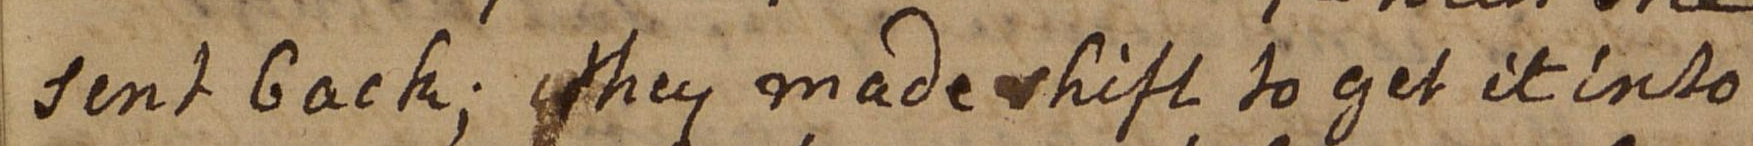sent back; they made shift to get it into
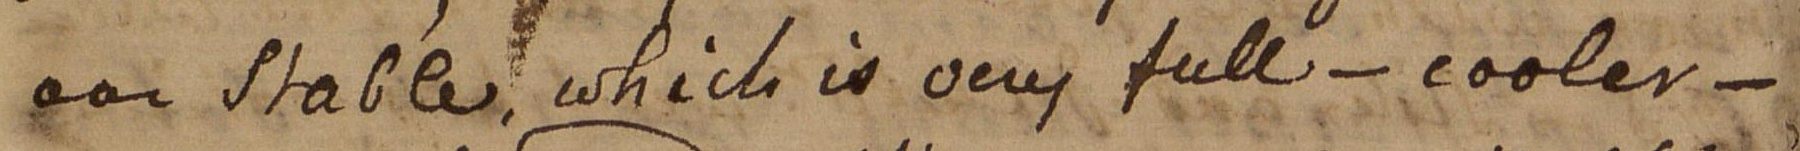our Stable, which is very full- cooler-
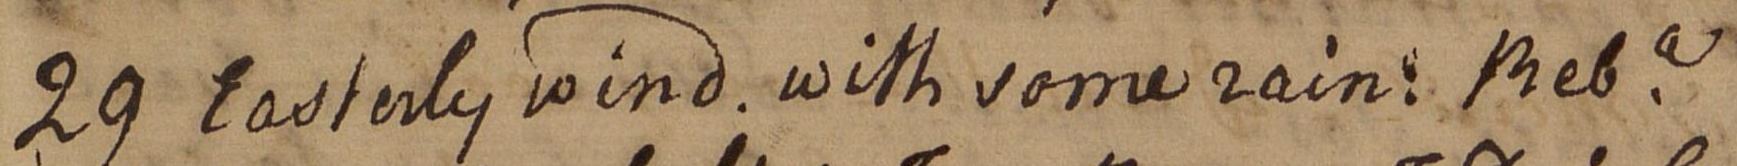29 Easterly wind with some rain: Reb^a.
